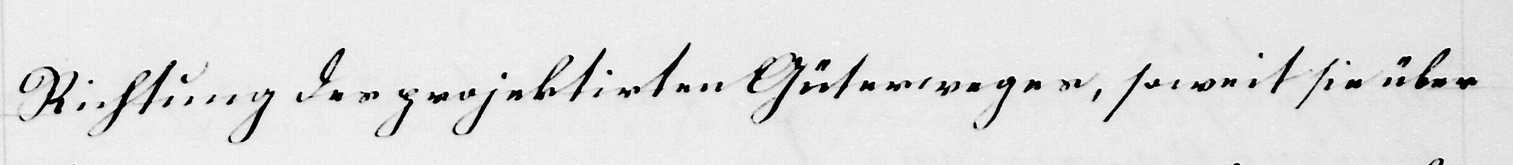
Richtung des projektirten Güterweges, soweit sie über
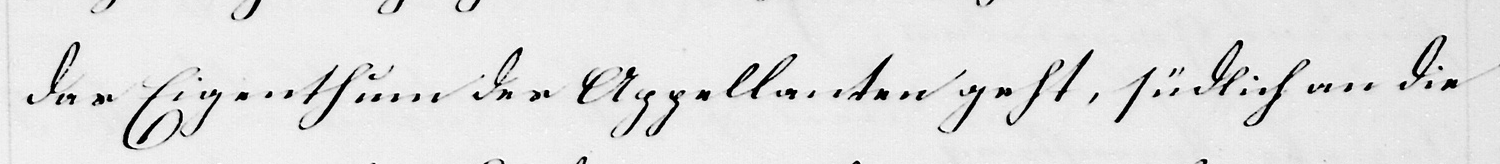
das Eigenthum des Appellanten geht, südlich an die
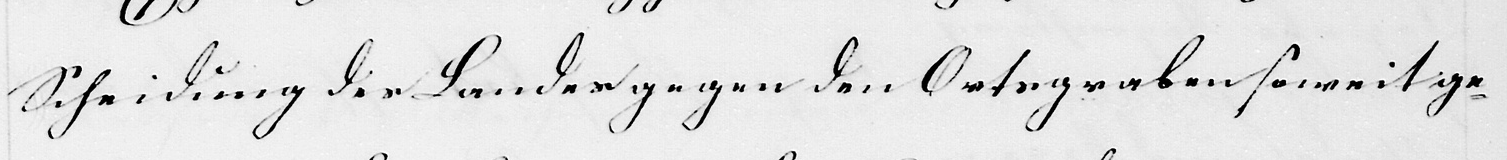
Scheidung des Landes gegen den Ortsgraben soweit ge¬
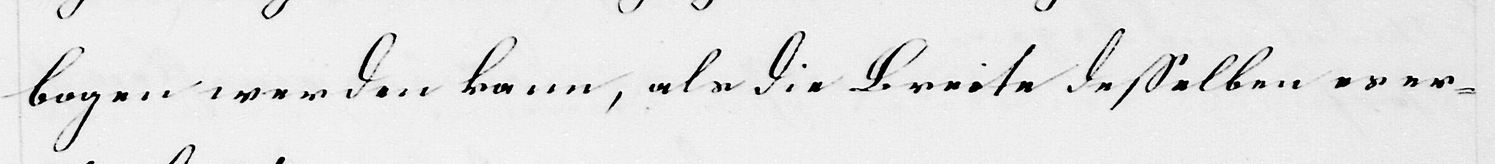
bogen werden kann, als die Breite deßelben es er¬
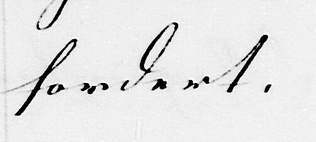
fordert.
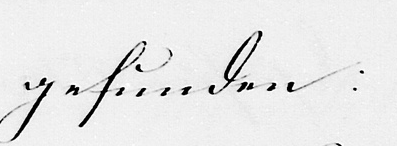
gefunden:
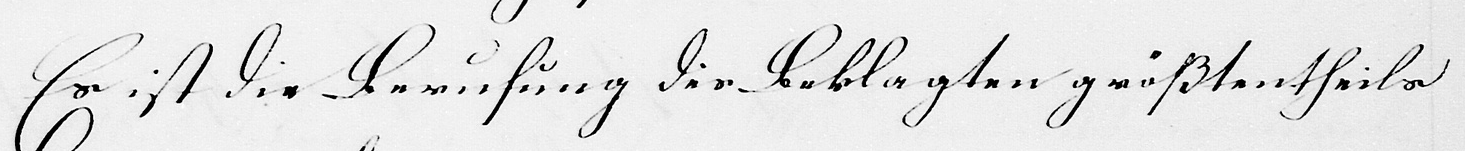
Es ist die Berufung des Beklagten größtentheils
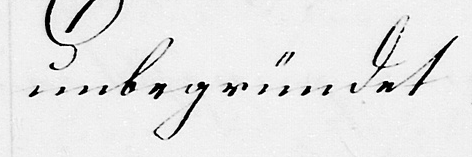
unbegründet,
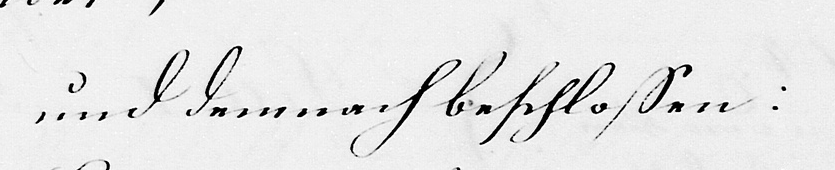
und demnach beschloßen:
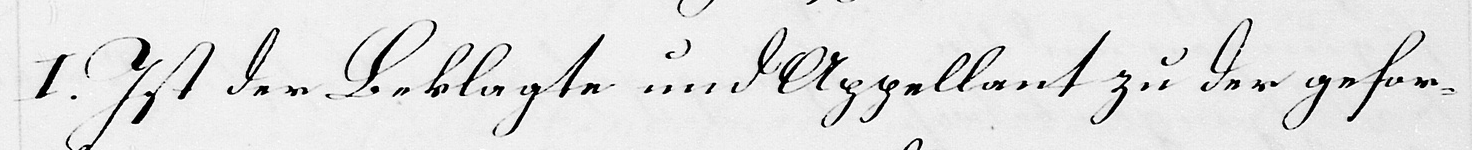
I. Ist der Beklagte und Appellant zu der gefor¬
